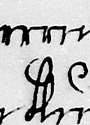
4.
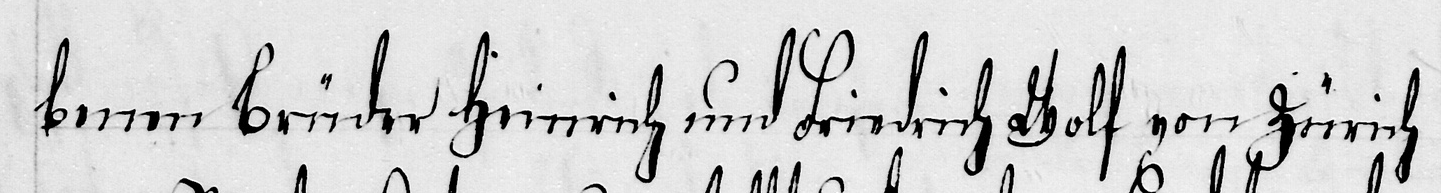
benen Brüder Heinrich und Friedrich Wolf von Zürich
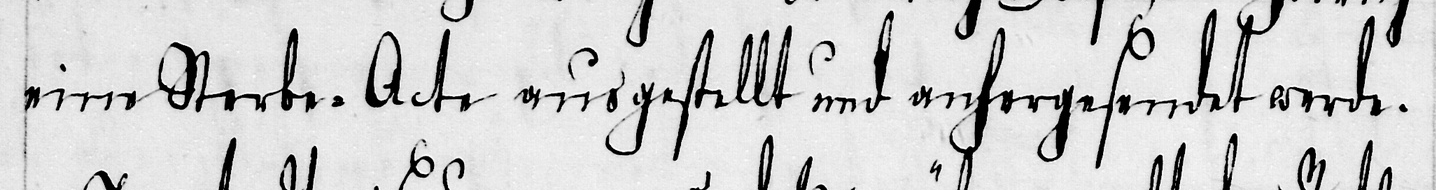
eine Sterbe-Acte ausgestellt und anhergesendet werde.
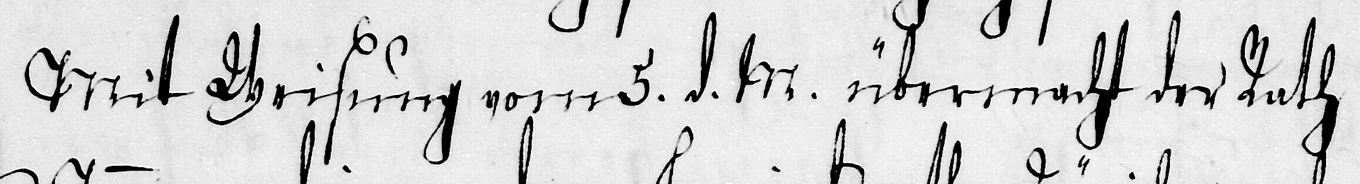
Mit Weisung vom 5. d. M. übermacht der Rath
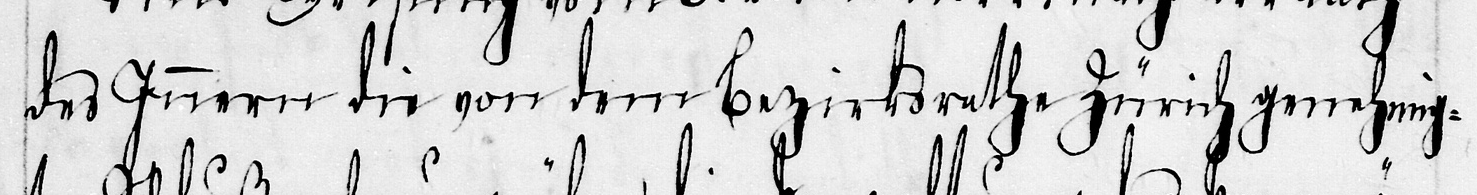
des Innern die von dem Bezirksrathe Zürich genehmig¬
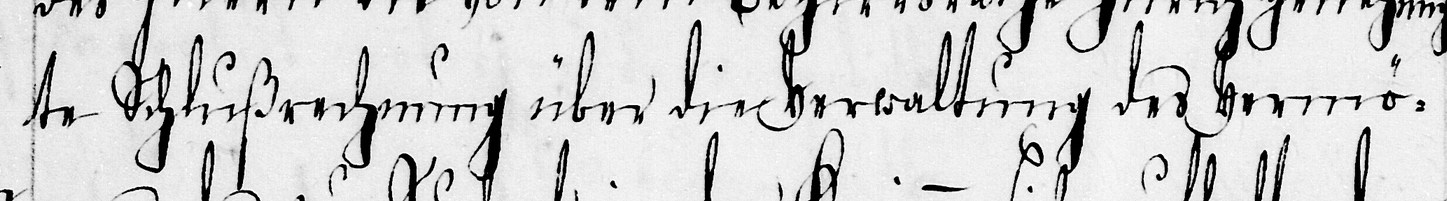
te Schlußrechnung über die Verwaltung des Vermö¬
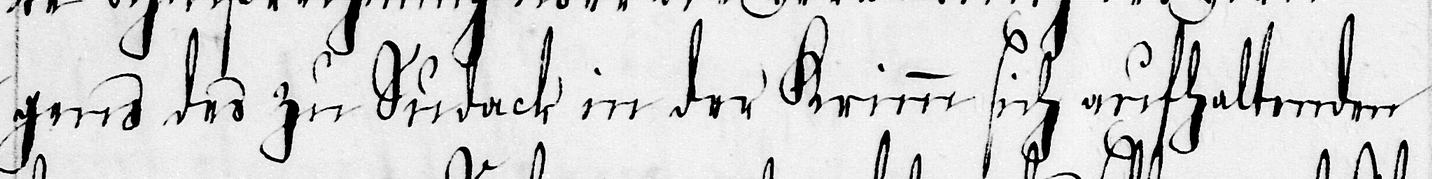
gens des zu Sudack in der Krimm sich aufhaltenden
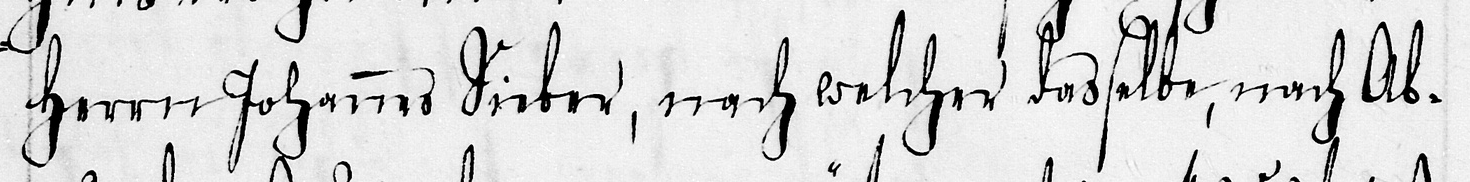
Herrn Johannes Sieber, nach welcher dasselbe, nach Ab¬
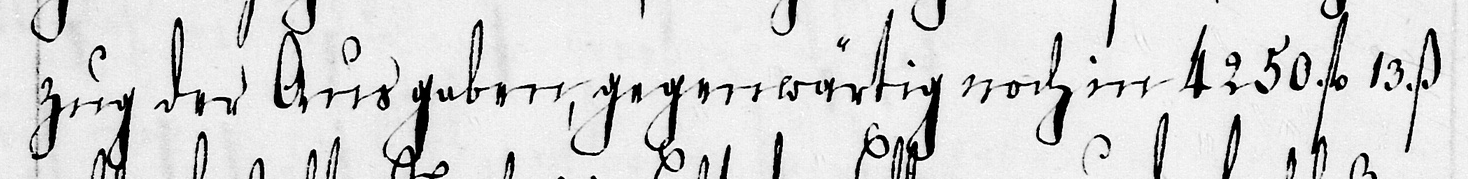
zug der Ausgaben, gegenwärtig noch in 4250. fl. 13. ß.
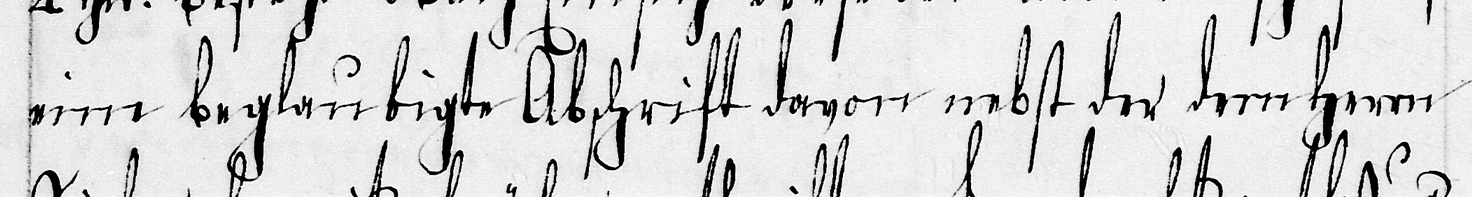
eine beglaubigte Abschrift davon nebst der dem Herrn
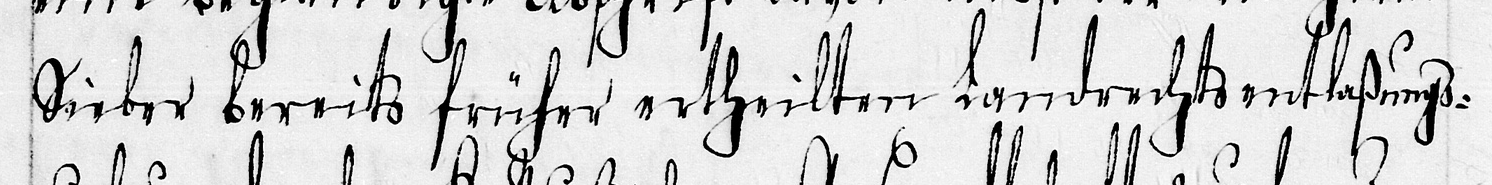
Sieber bereits früher ertheilten Landrechtsentlaßungs¬
